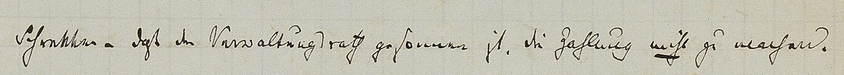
Schrekken – daß der Verwaltungsrath gesonnen ist, die Zahlung nicht zu machen.
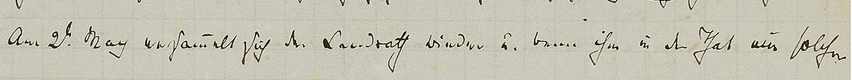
Am 2ten May versammelt sich der Landrath wieder u. wenn ihm in der That ein solcher
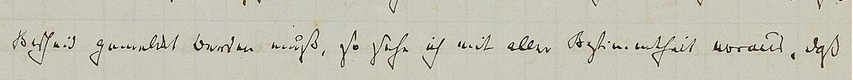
Bescheid gemacht werden muß, so sehe ich mit aller Bestimmtheit voraus, daß
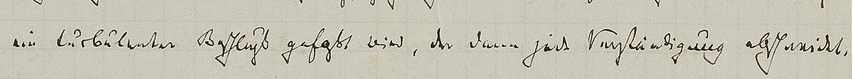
ein turbulenter Beschluß gefaßt wird, der dann jede Verständigung abschneidet.
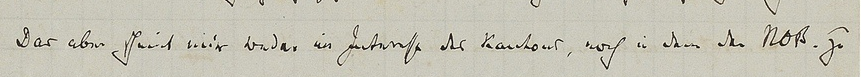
Das aber scheint mir weder im Interesse des Kantons, noch in dem der NOB. zu
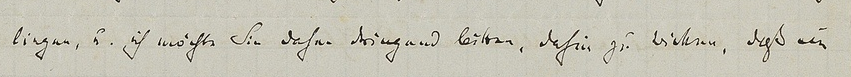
liegen, u. ich möchte Sie daher dringend bitten, dahin zu wirken, daß ein
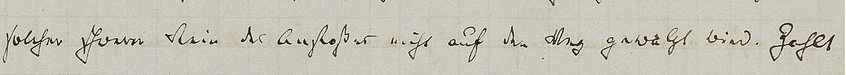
solcher schwerer Stein des Anstoßes nicht auf den Weg gewälzt wird. Zahlt
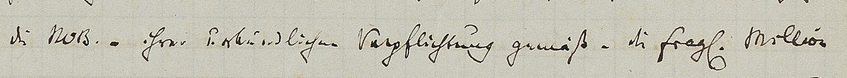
die NOB. – ihrer urkundlichen Verpflichtung gemäß – die fragl. Million
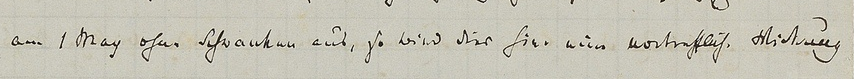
am 1 May ohne Schwanken aus, so wird dies hier nun vortreffliche Wirkung
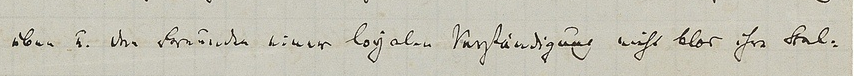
üben u. den Freunden einer loyalen Verständigung nicht blos ihre Stel-
